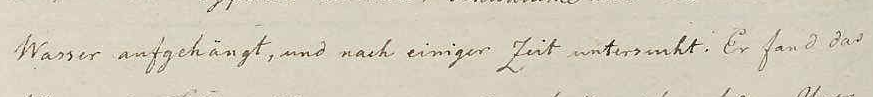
Wasser aufgehängt, und nach einiger Zeit untersucht. Er fand das
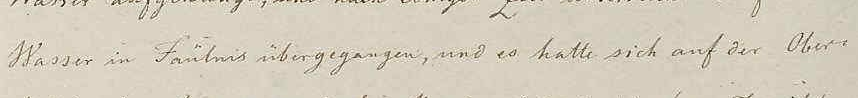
Wasser in Fäulnis übergegangen, und es hatte sich auf der Ober-
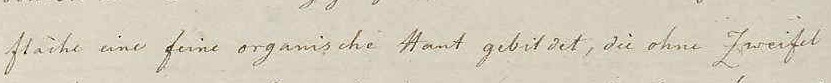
fläche eine feine organische Haut gebildet, die ohne Zweifel
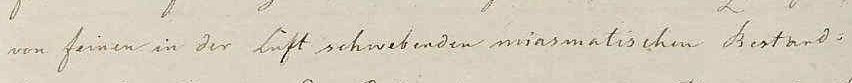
von feinen in der Luft schwebenden miasmatischen Bestand-
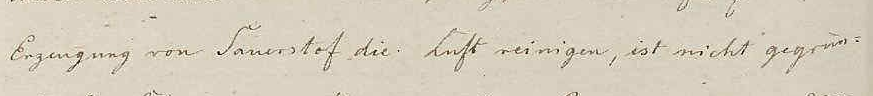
Erzeugung von Sauerstof die Luft reinigen, ist nicht gegrün-
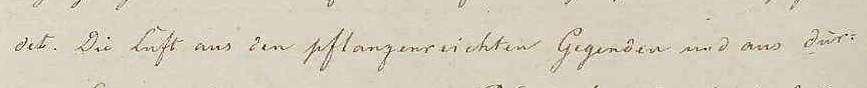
det. Die Luft aus den Gegenden und aus dür-
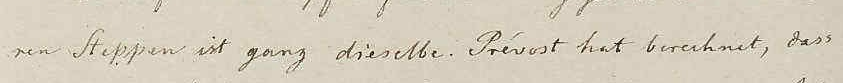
ren Steppen ist ganz dieselbe. Prévost hat berechnet, dass
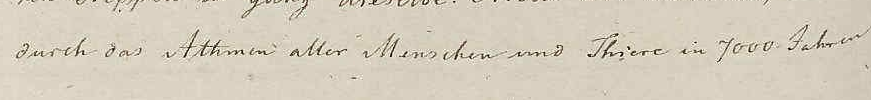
durch das Athmen aller Menschen und Thiere in 7000 Jahren
